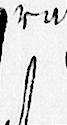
b¬
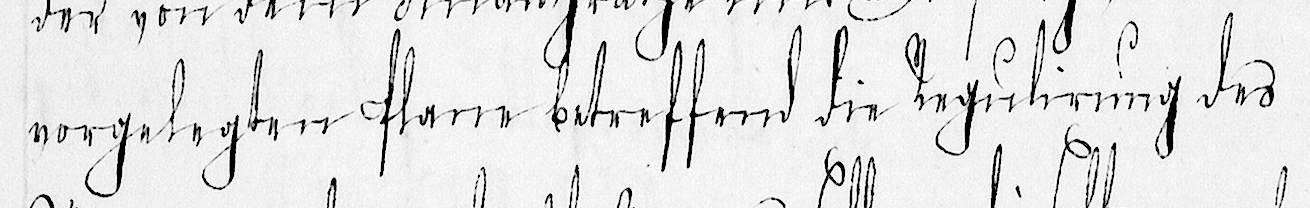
vorgelegten Plane betreffend die Regulirung des
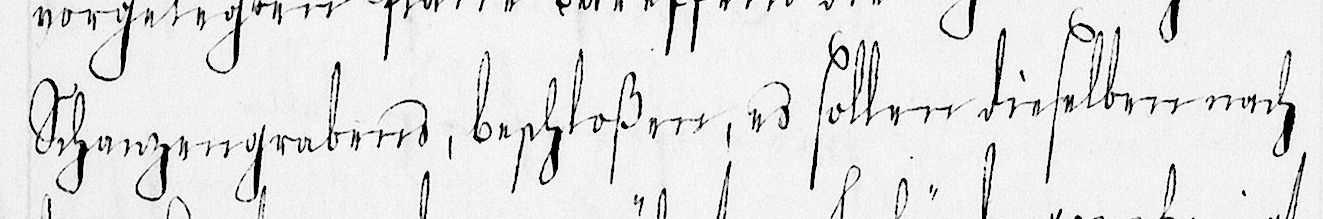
Schanzengrabens, beschloßen, es sollen dieselben nach
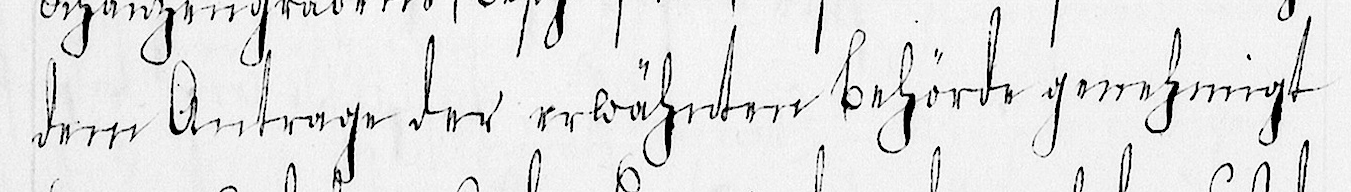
dem Antrage der erwähnten Behörde genehmigt
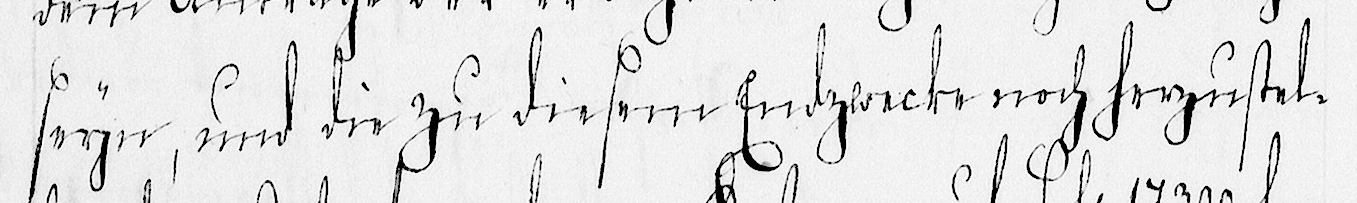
seyn, und die zu diesem Endzwecke noch herzustel¬
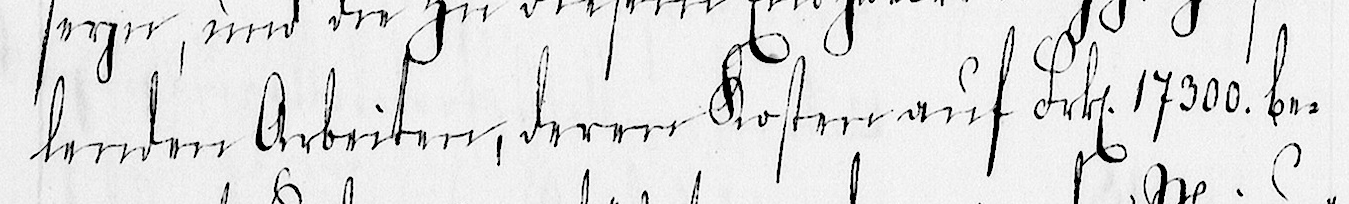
lenden Arbeiten, deren Kosten auf Frk[en].
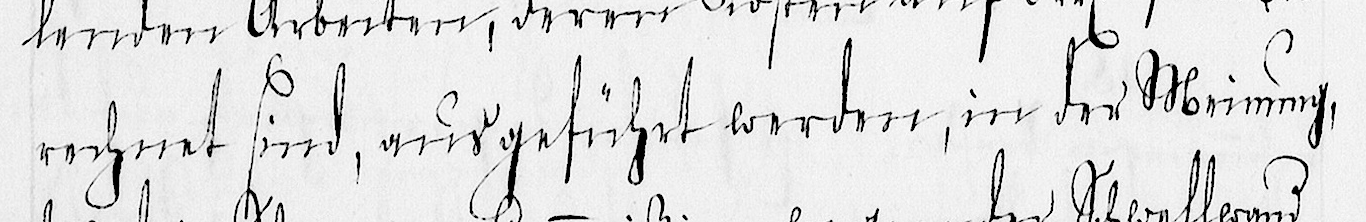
erechnet sind, ausgeführt werden, in der Meinung,
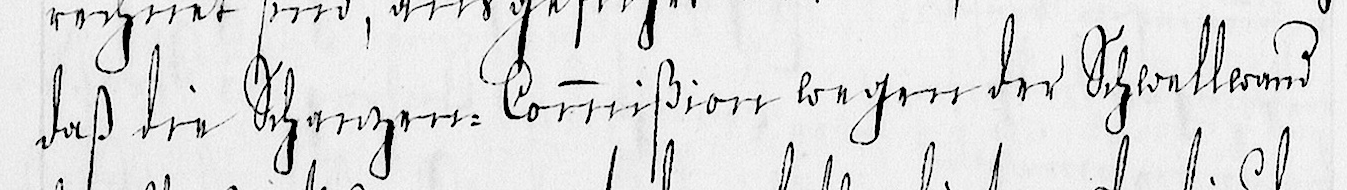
daß die Schanzen-Commißion wegen der Schwellwand
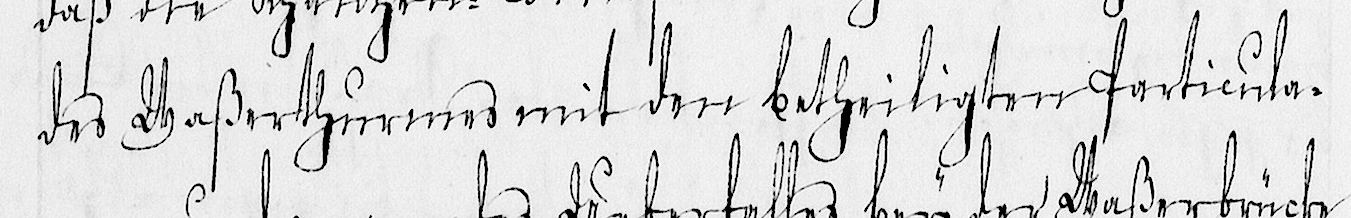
des Waßerthurmes mit den betheiligten Particula¬
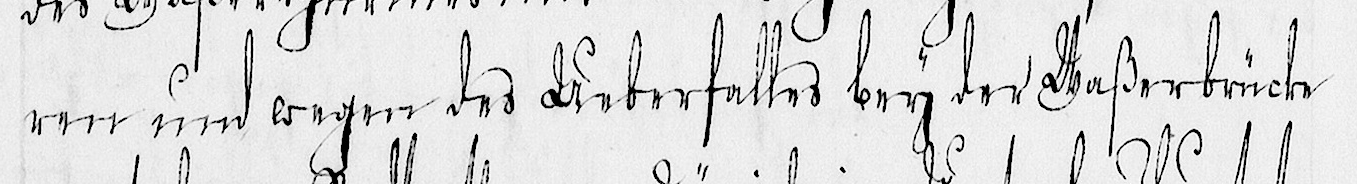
ren und wegen des Ueberfalles bey der Waßerbrücke
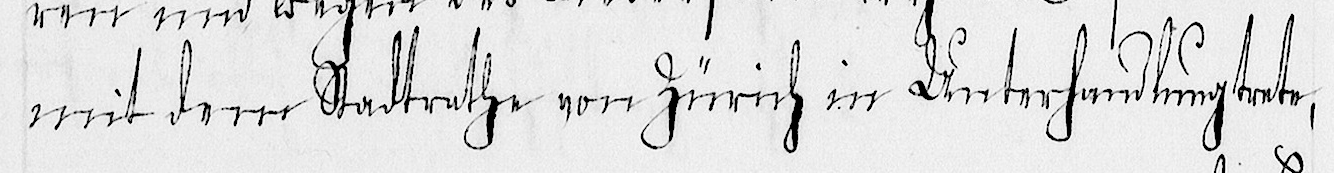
mit dem Stadtrathe von Zürich in Unterhandlung tret¬
